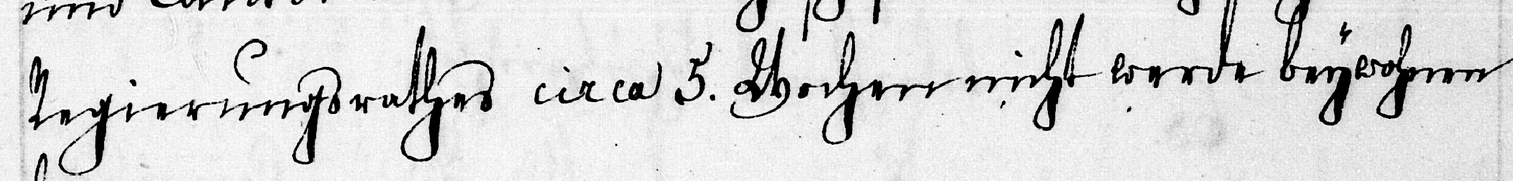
Regierungsrathes circa 5. Wochen nicht werde beywohnen
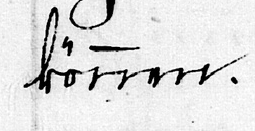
können.
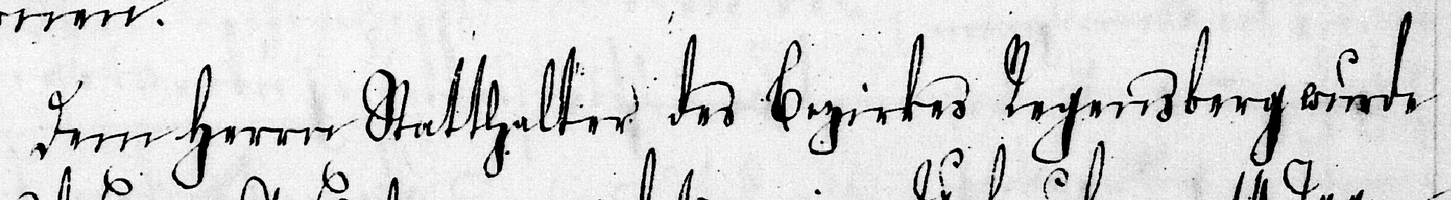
Dem Herrn Statthalter des Bezirkes Regensberg wurde
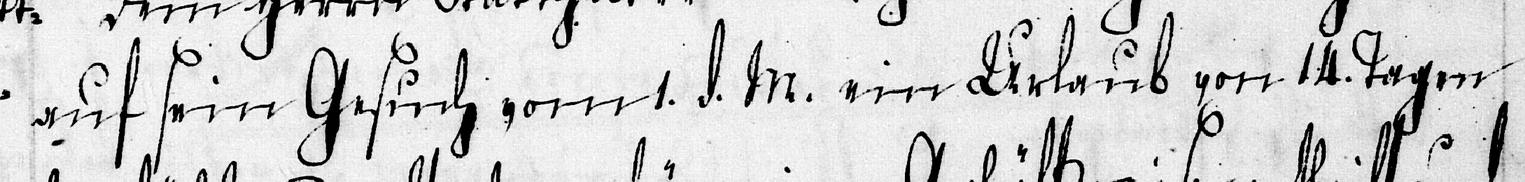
auf sein Gesuch vom 1. d. M. ein Urlaub von 14. Tagen
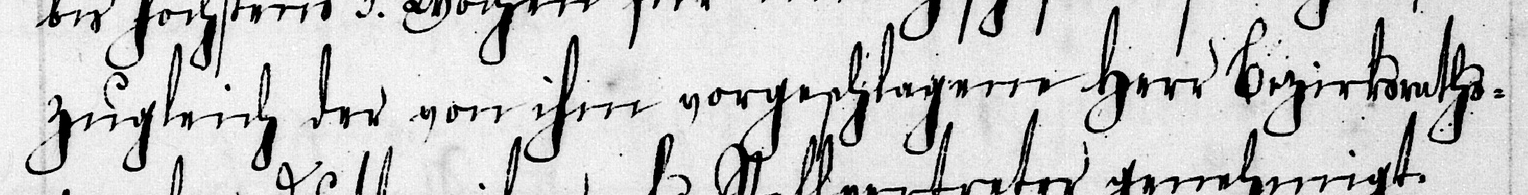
zugleich der von ihm vorgeschlagene Herr Bezirksraths¬
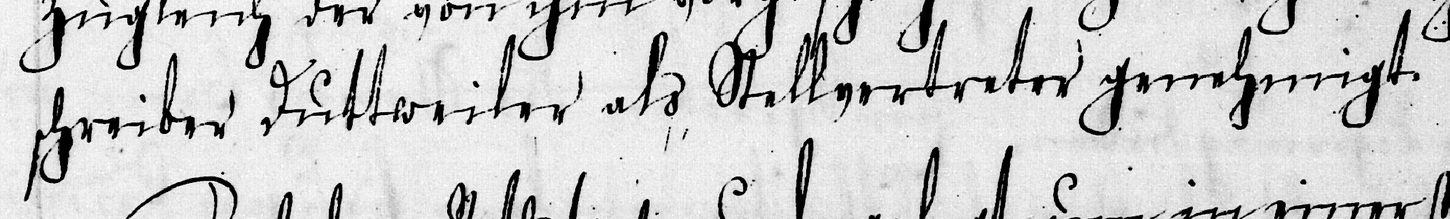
schreiber Duttweiler als Stellvertreter genehmigt.
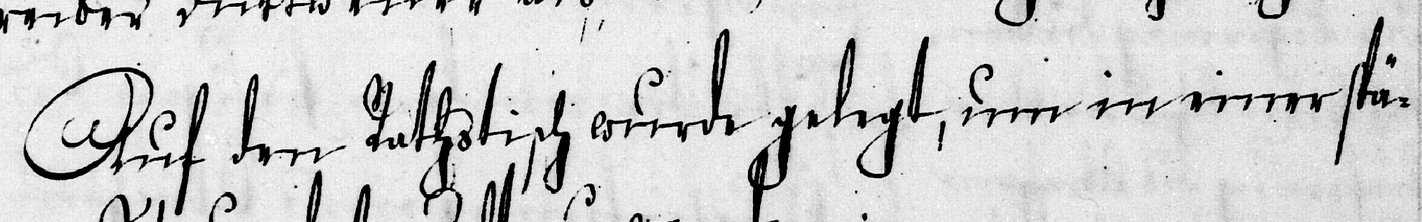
Auf den Rathstisch wurde gelegt, um in einer spä¬
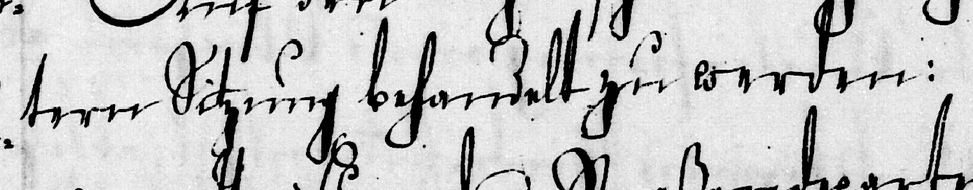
tern Sitzung behandelt zu werden:
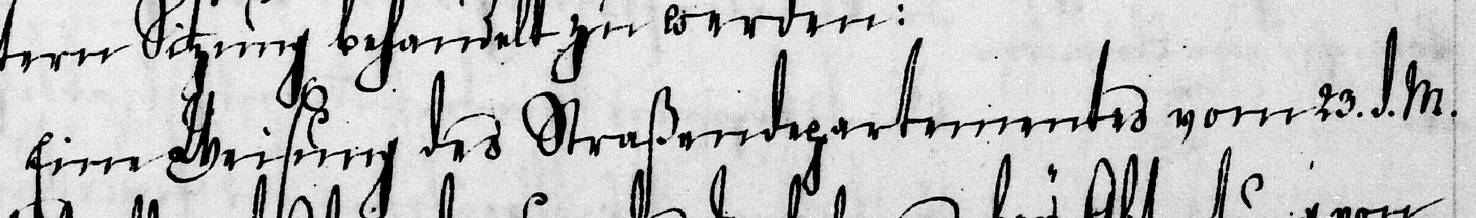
Eine Weisung des Straßendepartementes vom 23. d. M.
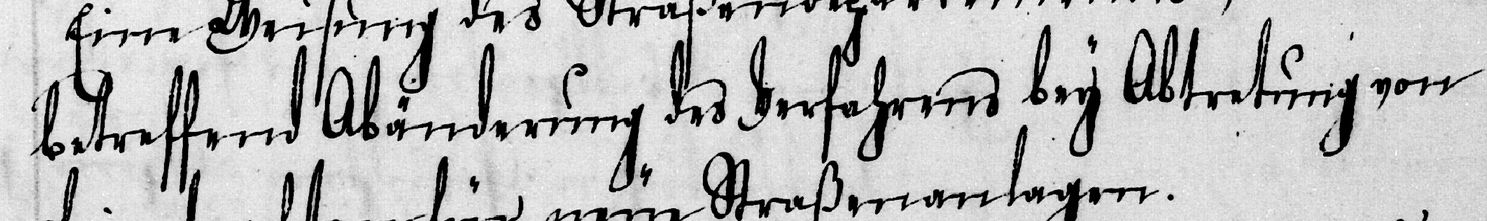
betreffend Abänderung des Verfahrens bey Abtretung von
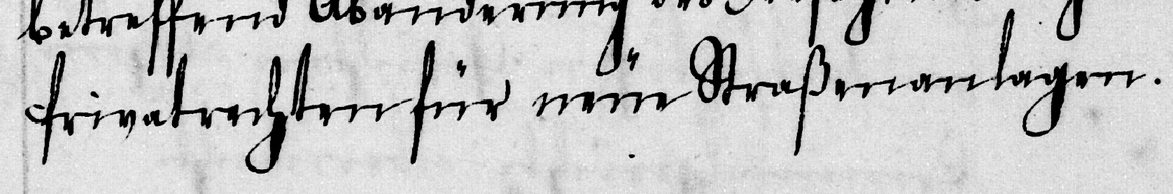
Privatrechten für neue Straßenanlagen.
